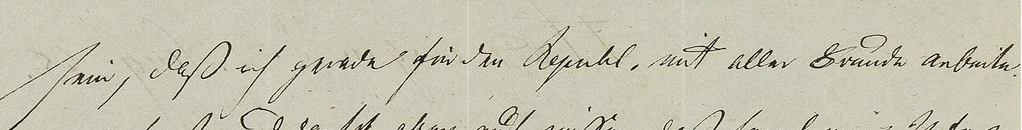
sein, daß ich gerade für den Republ. mit aller Freude arbeite.
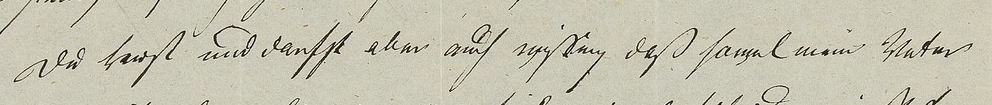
Du kannst und darfst aber auch wissen, daß sowol mein Vater
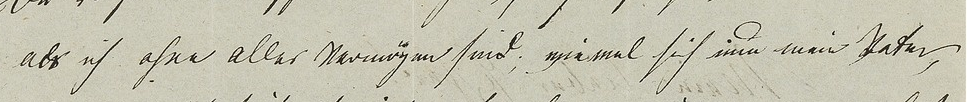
als ich ohne alles Vermögen sind; wiewol sich nun mein Vater,
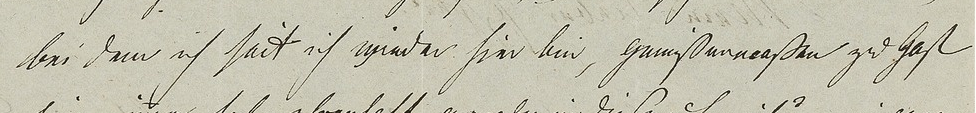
bei dem ich seit ich wieder hier bin, gewissermaßen zu Gast
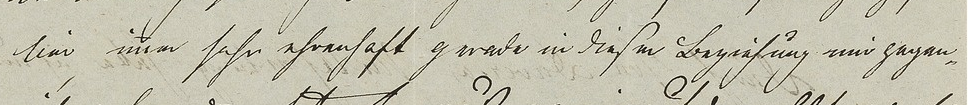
bin, immer sehr ehrenhaft gerade in dieser Beziehung mir gegen-
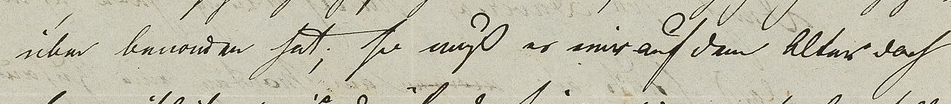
über benommen hat; so muß es mir auf dem Alter doch
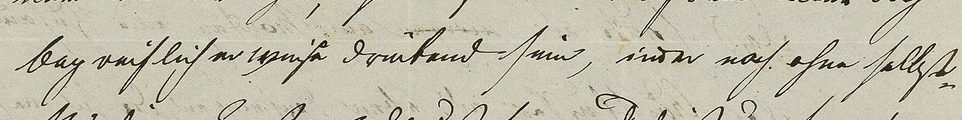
begreiflicherweise drückend sein, immer noch ohne selbst-
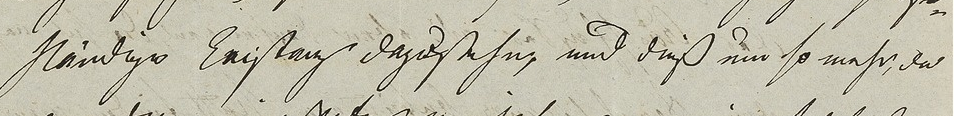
ständige Existenz dazustehn, und dieß um so mehr, da
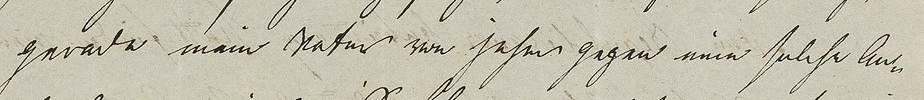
gerade mein Vater von jeher gegen eine solche An-
